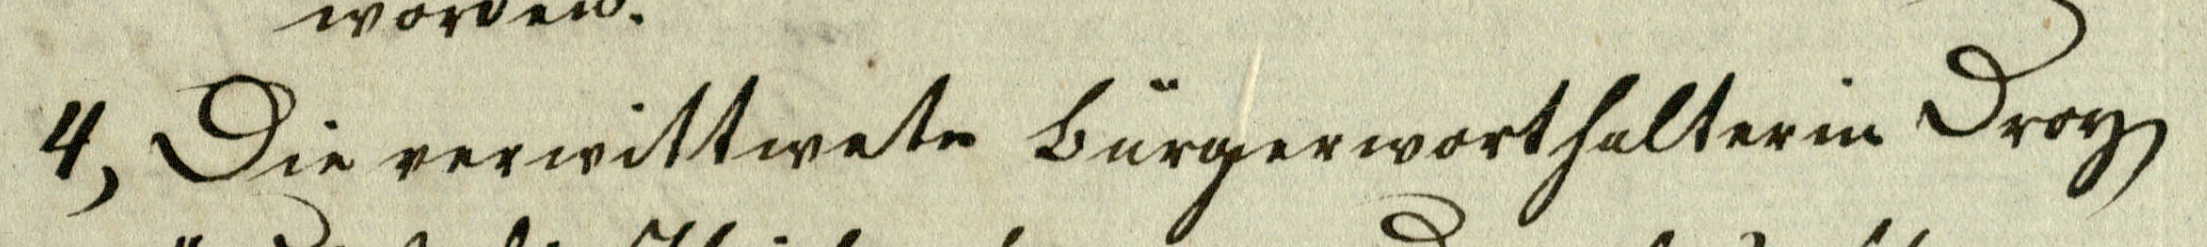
4, Die verwittwete Bürgerworthalterin Droy¬
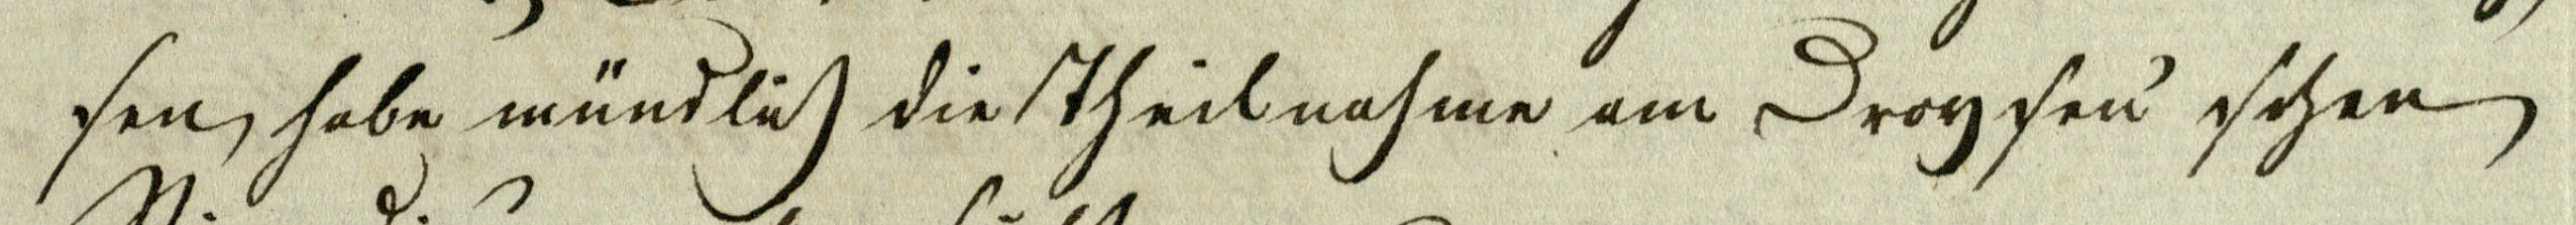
sen, habe mündlich die Theilnahme Droysen'schen
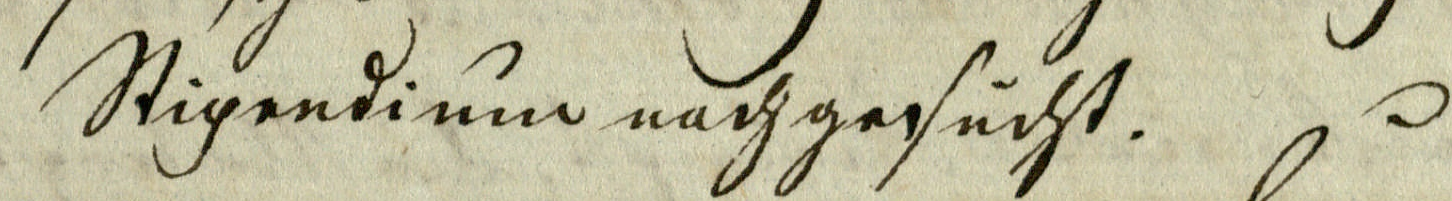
Stipendium nachgesucht.
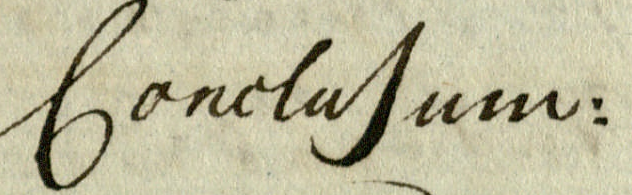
Conclusum:
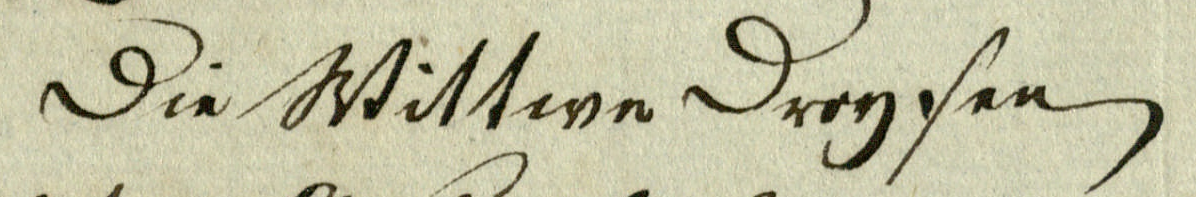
Die Wittwe Droysen
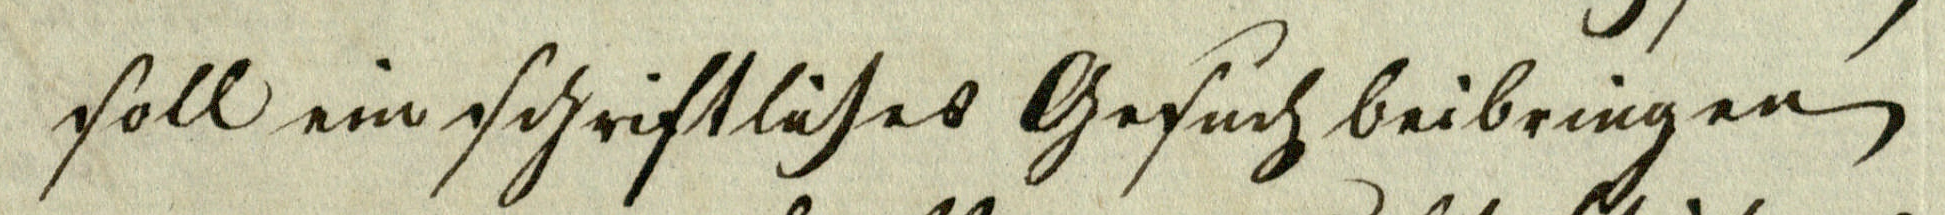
soll ein schriftliches Gesuch beibringen,
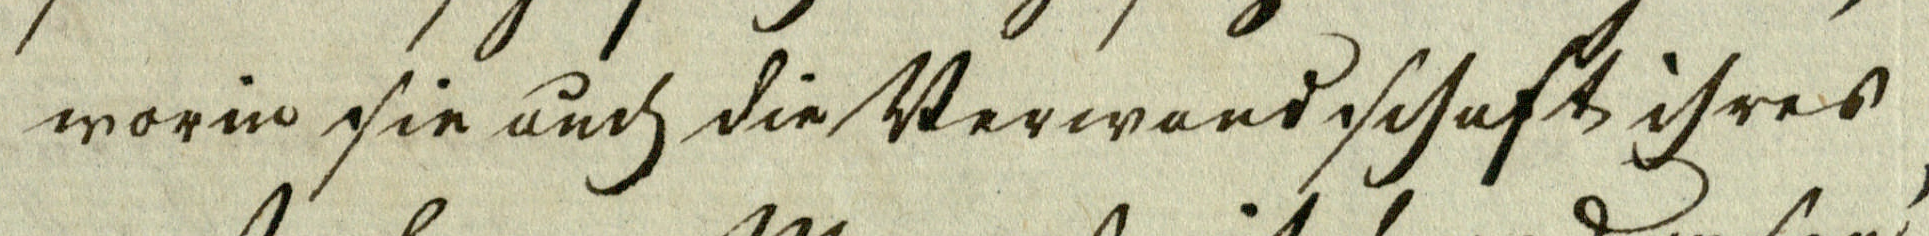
worin sie auch die Verwandschaft ihres
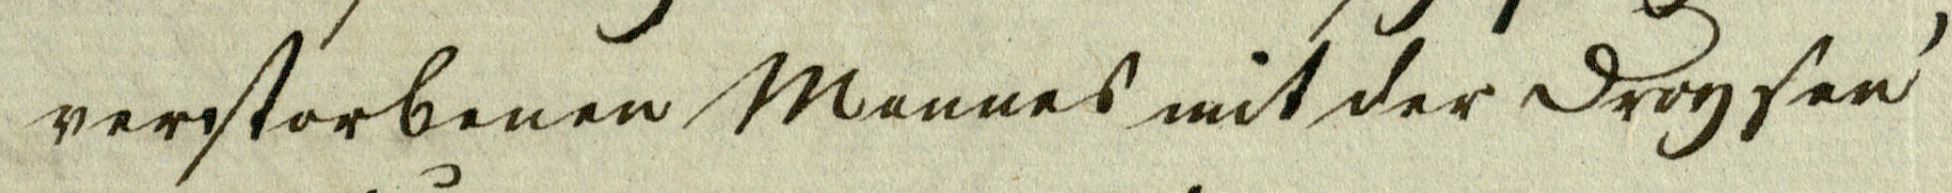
verstorbenen Mannes mit der Droysen'
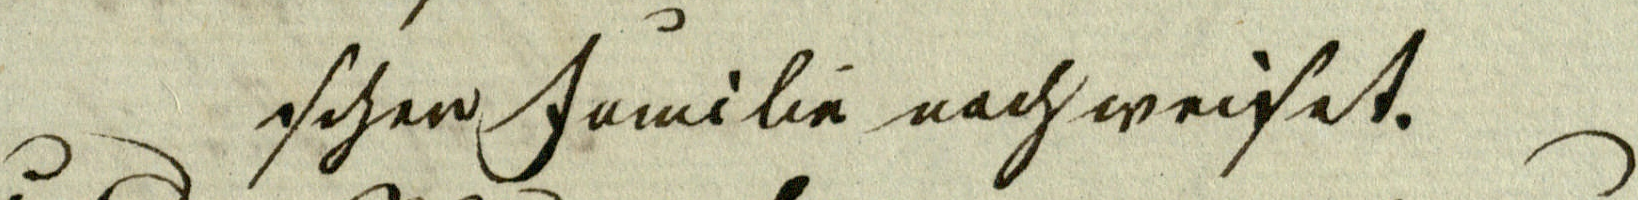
schen Familie nachweiset.
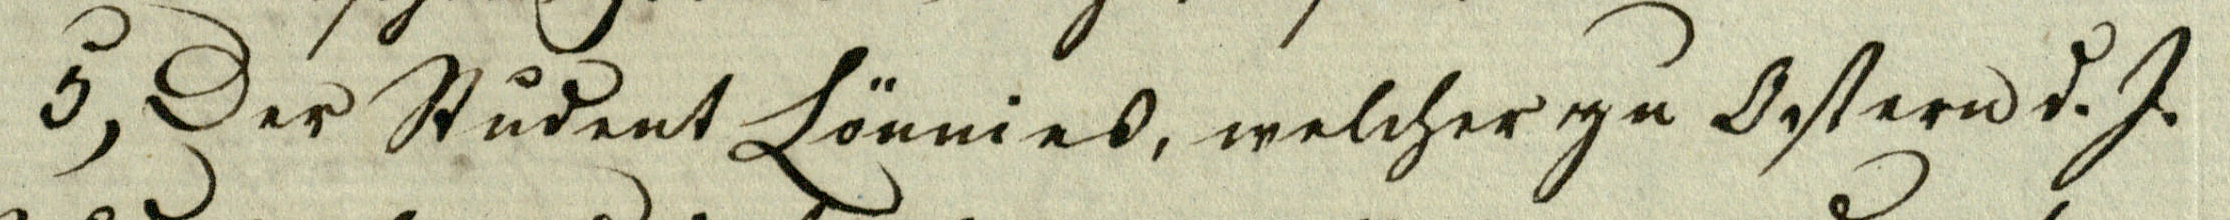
5, Der Student Lönnies, welcher zu Ostern d. J.
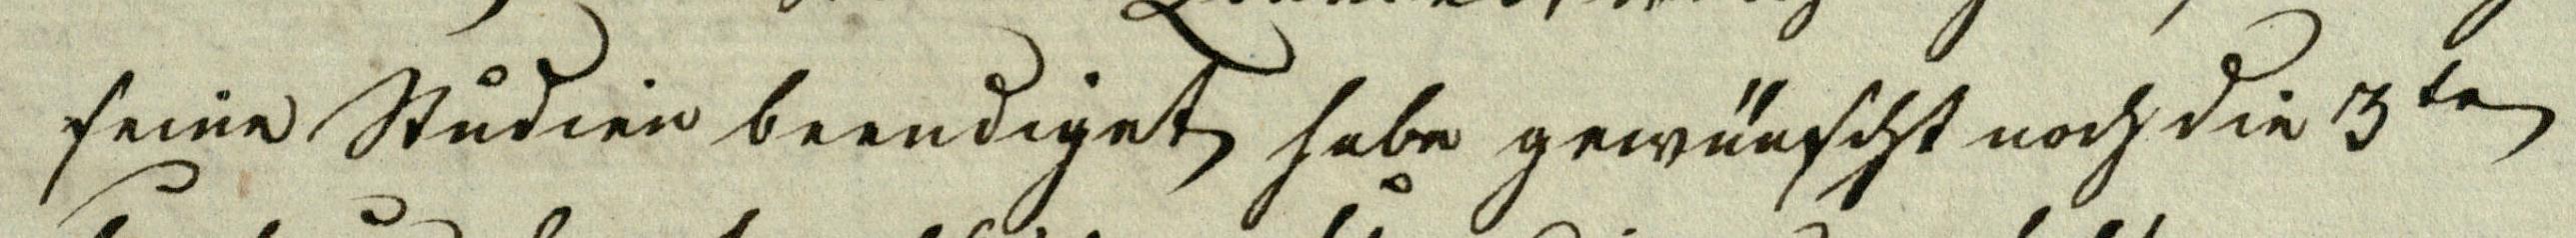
seine Studien beendiget, habe gewünscht noch die 3te
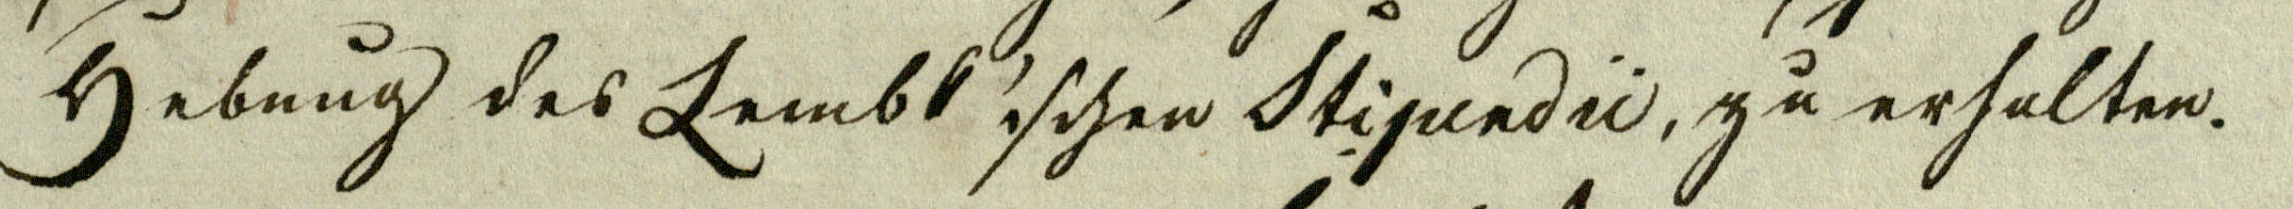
Hebung des Lembk'schen Stipendii, zu erhalten.
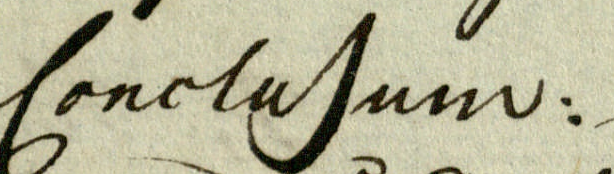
Conclusum:
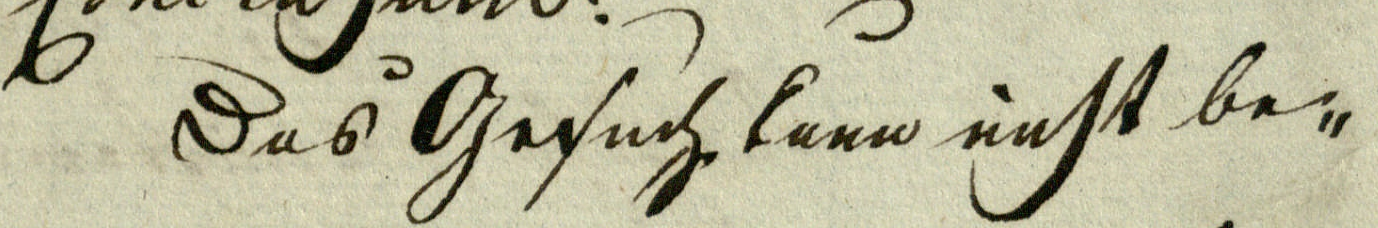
Das Gesuch kann nicht be¬
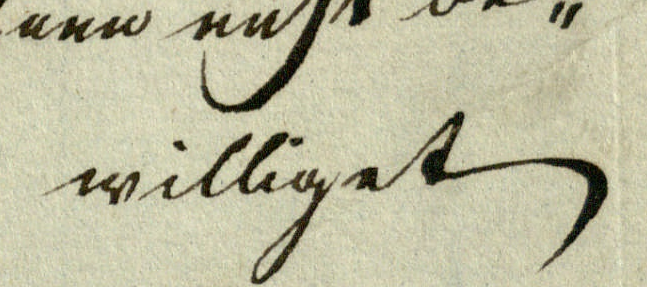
williget
